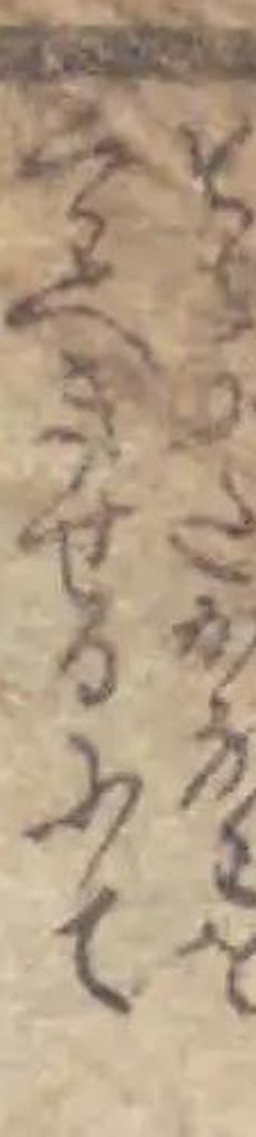くわへぎせるにて
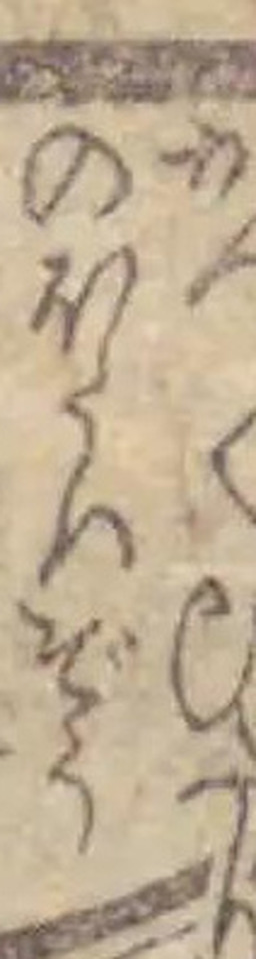のほうハぞう
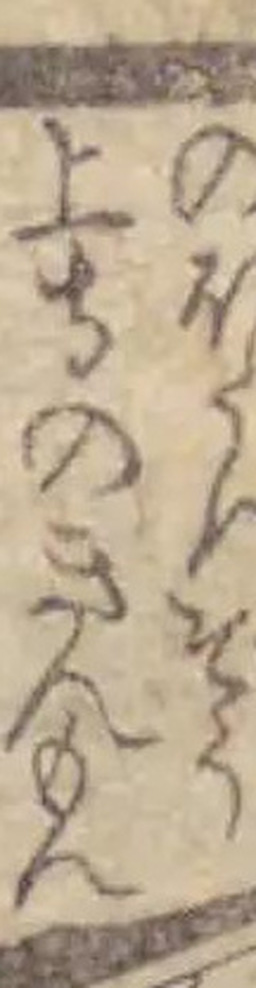上寺のきんもん
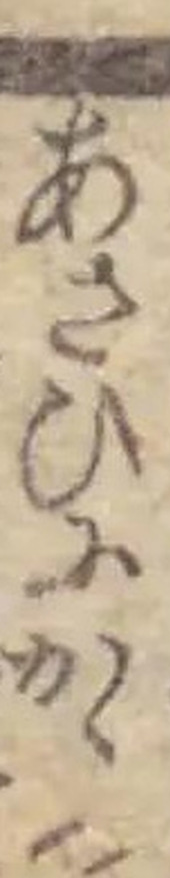あさひにかゝ
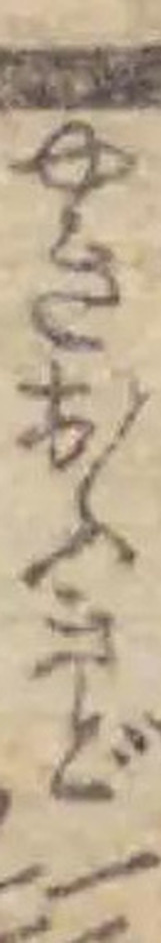やきおふきど
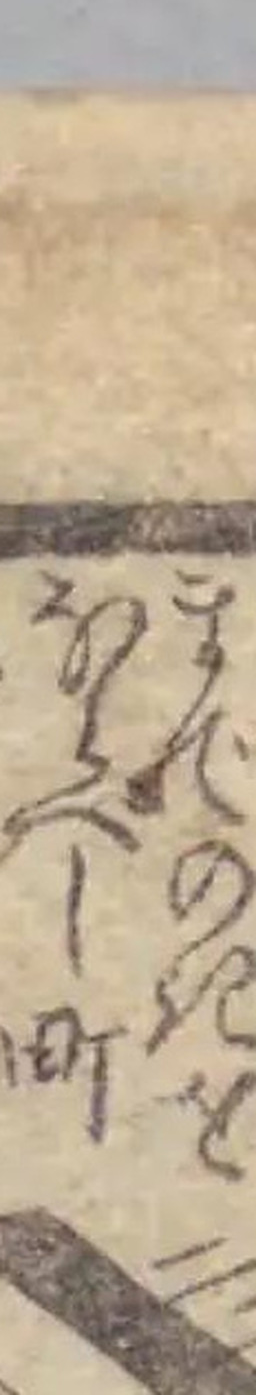ならへし町
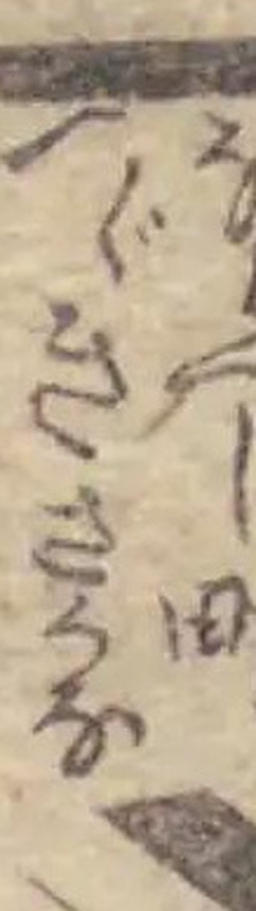つゞきさかな
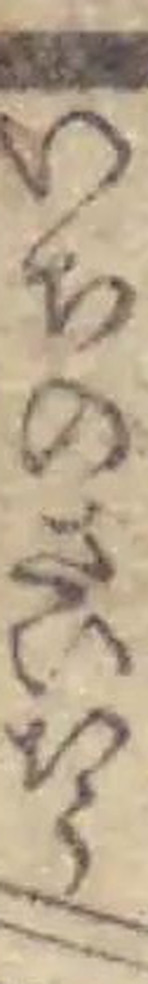いちのさいちう
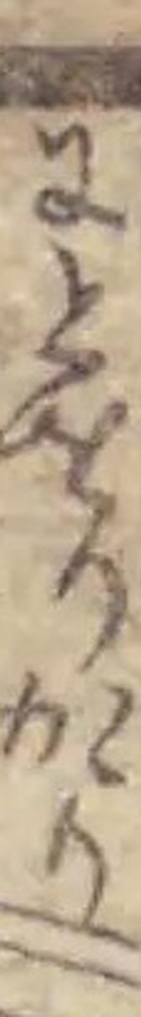にとをりかゝり
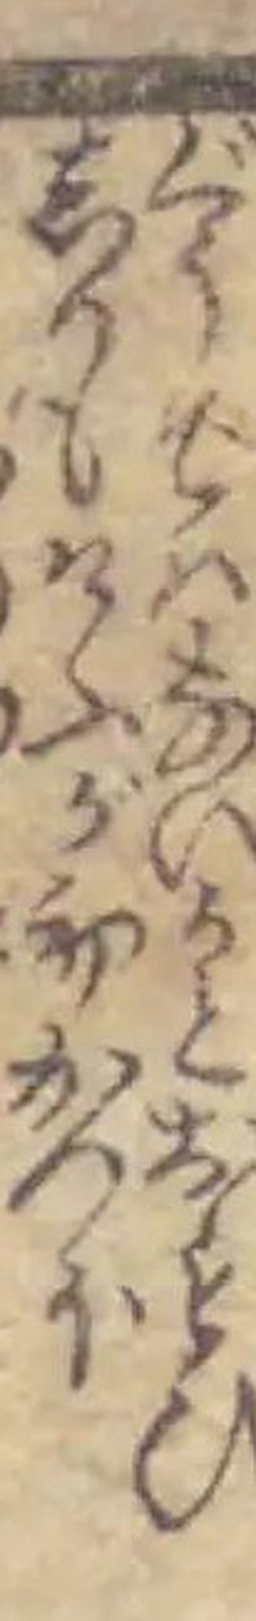しかもけふが初かつほ
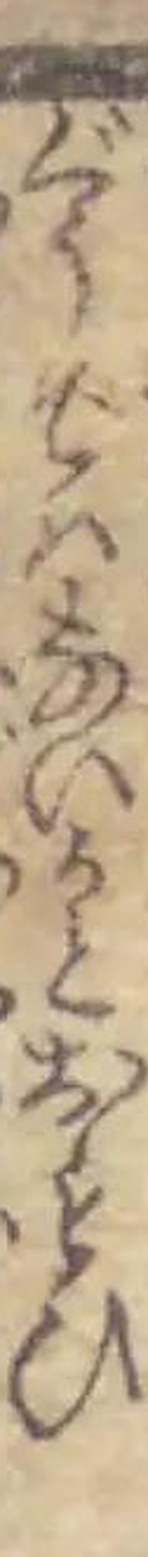ぐうでハないかとおもひ
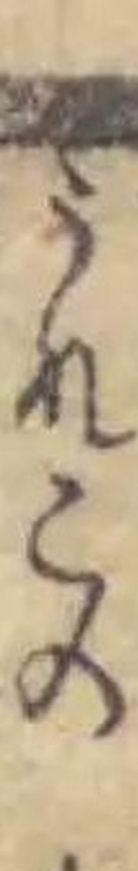うれこの
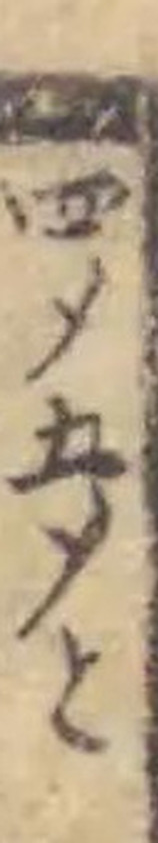四〆五〆と
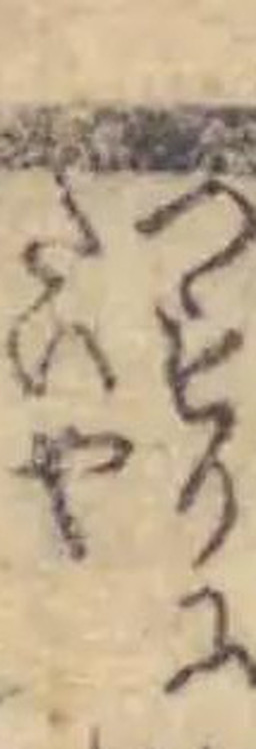たいや
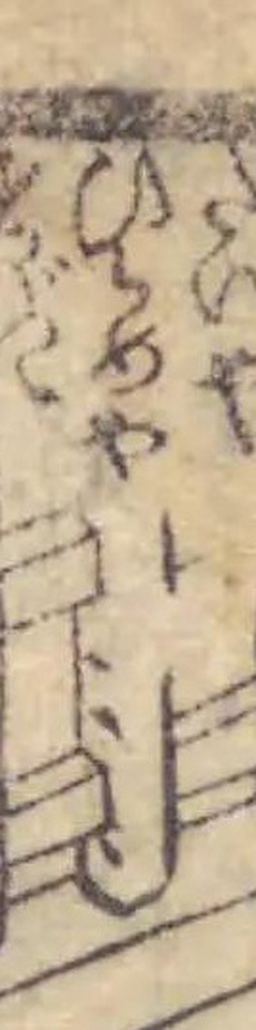ひらめや
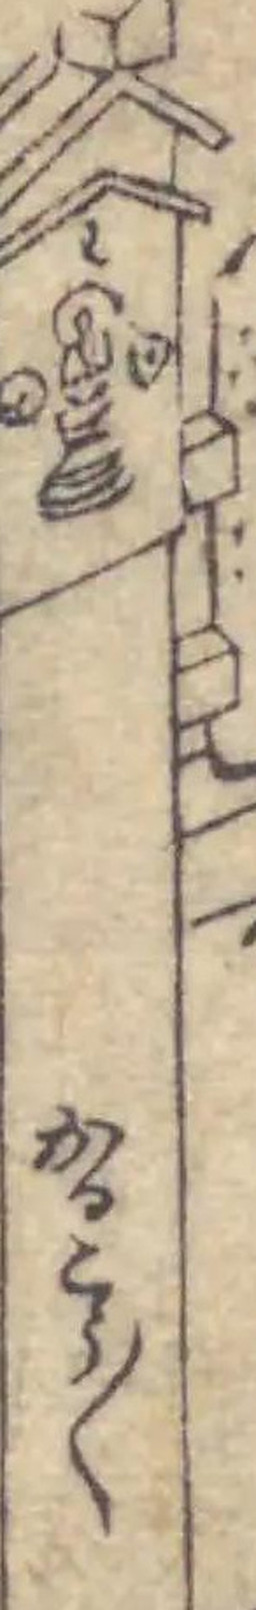かるこう〳〵
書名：豆男江戸見物 2巻
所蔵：国立国会図書館 National Diet Library, JAPAN
